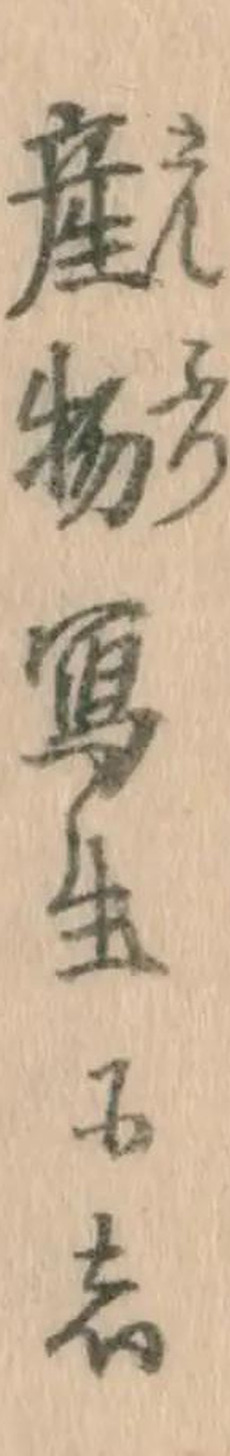産物写生にし
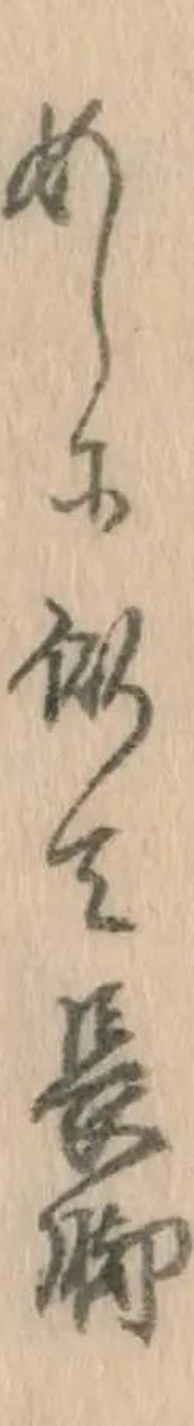めしに似て長脚
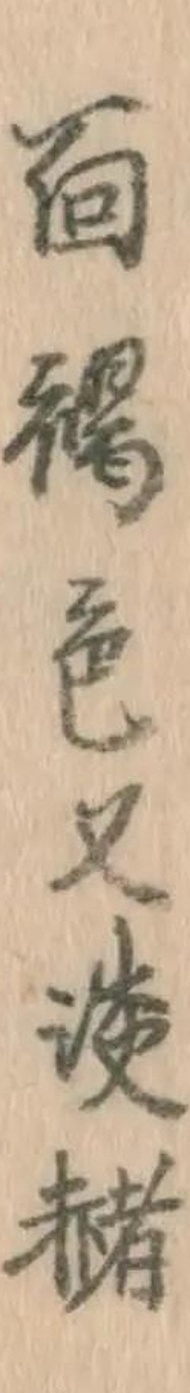面褐色又淡赭
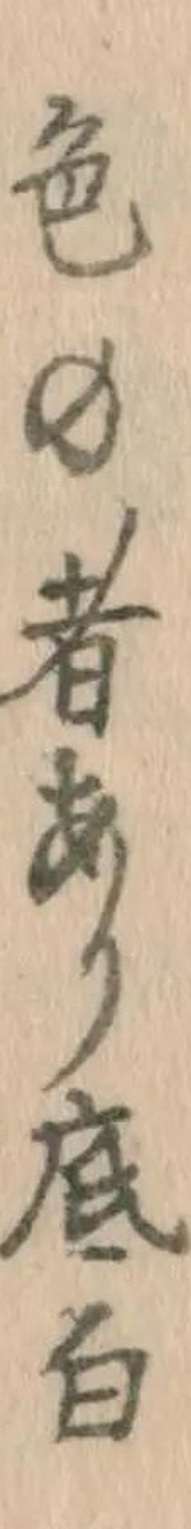色の者あり底白
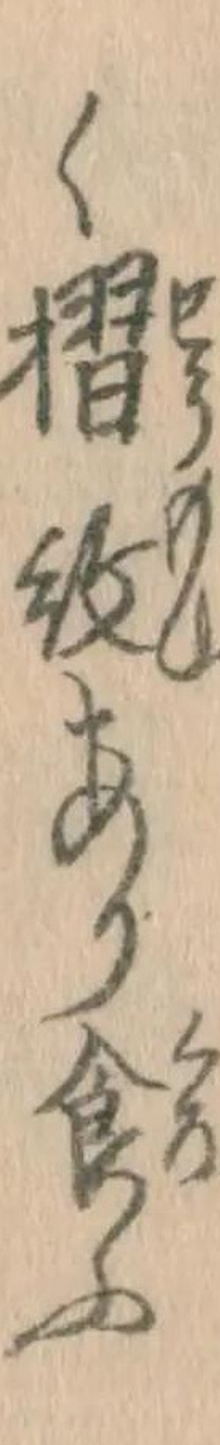く摺紋あり食ふ
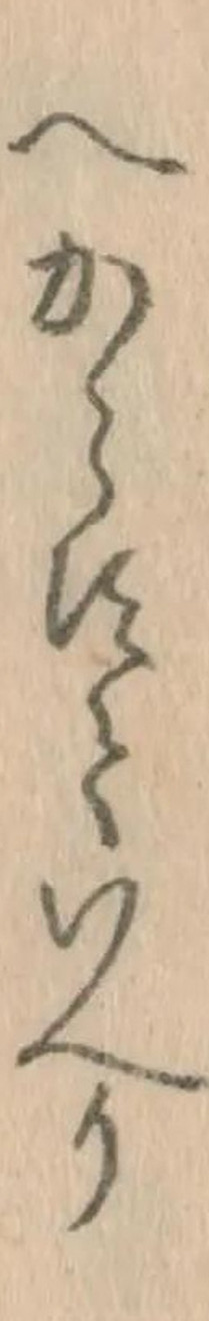へからすといへり

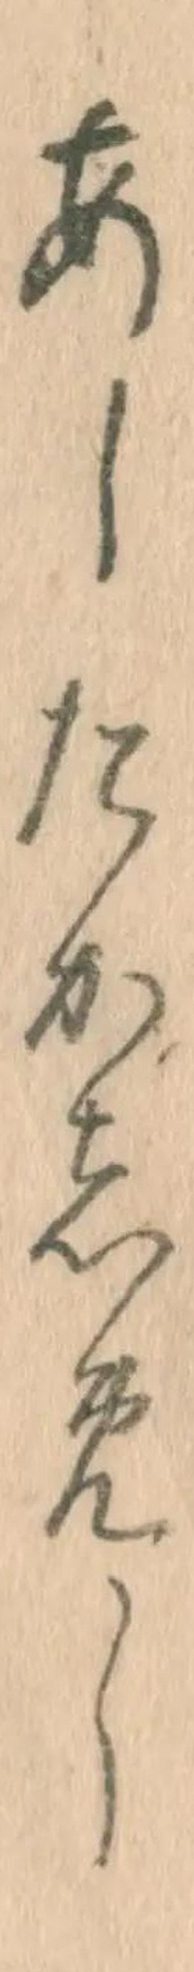あしたかしめし
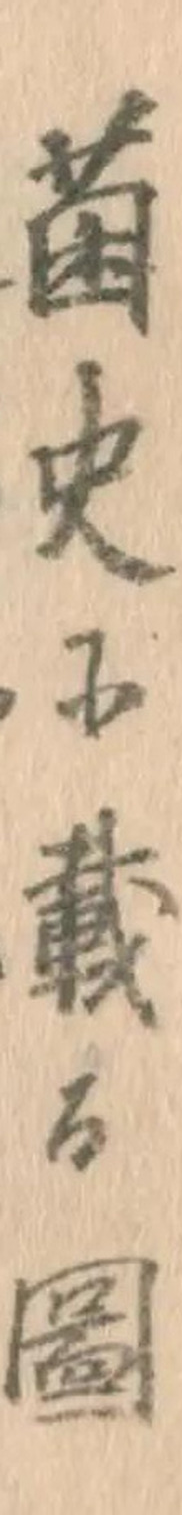菌史に載る図
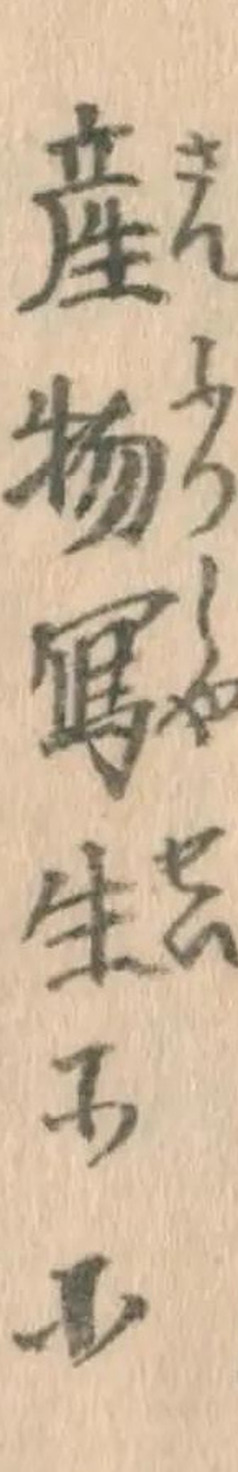産物写生に小
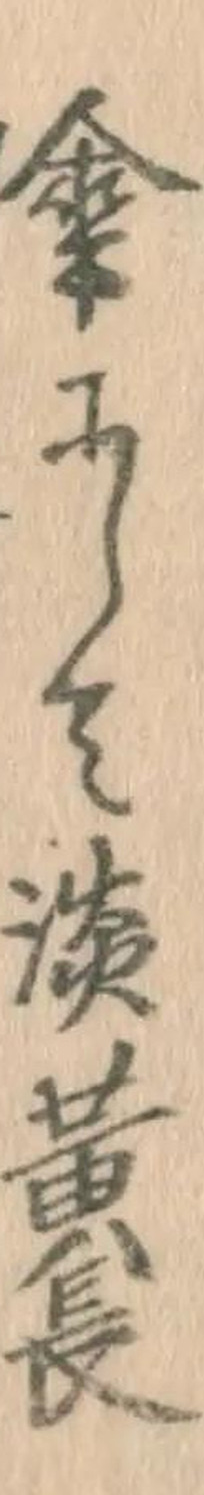傘にして淡黄長
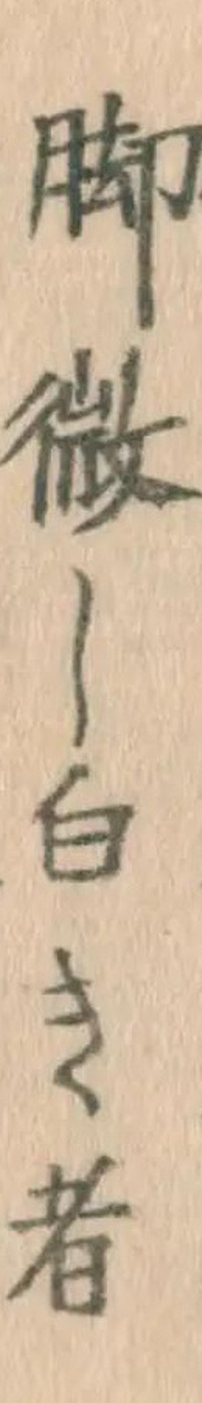脚微し白き者
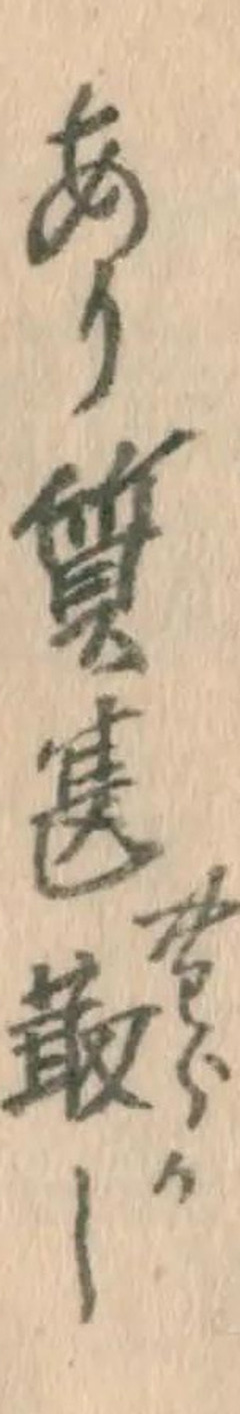あり質甚し
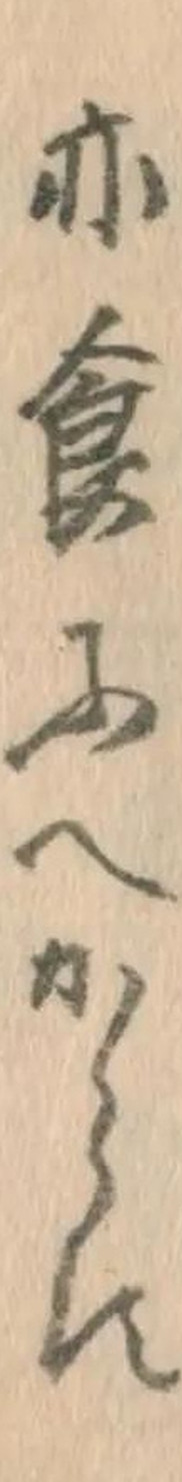亦食ふへからす
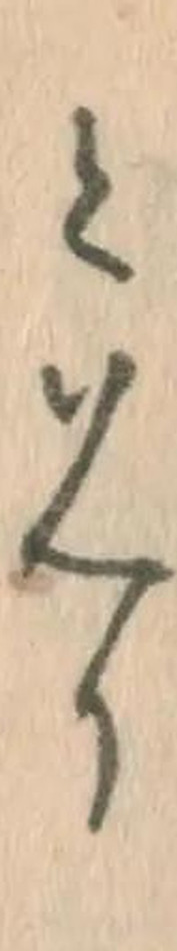といへり
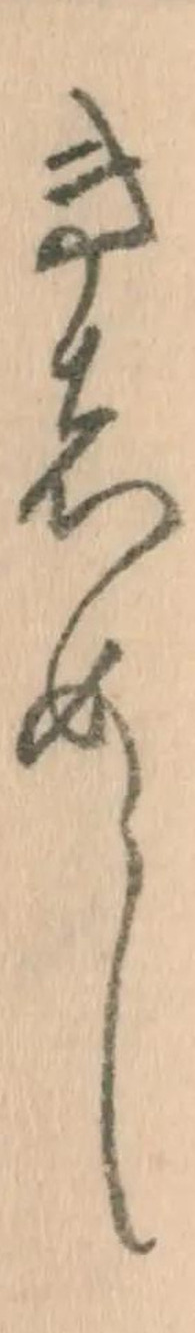きしめし
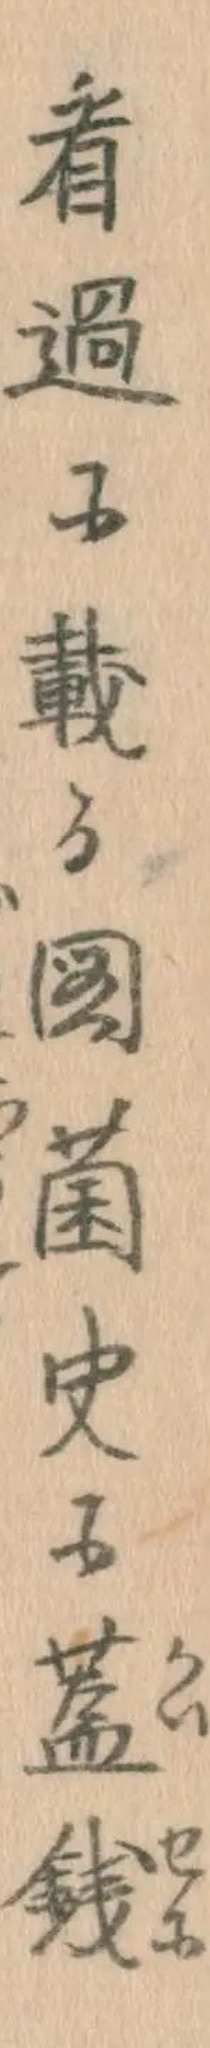看過に載る図菌史に蓋銭
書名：本草図譜. 巻55-57
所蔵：国立国会図書館 National Diet Library, JAPAN
